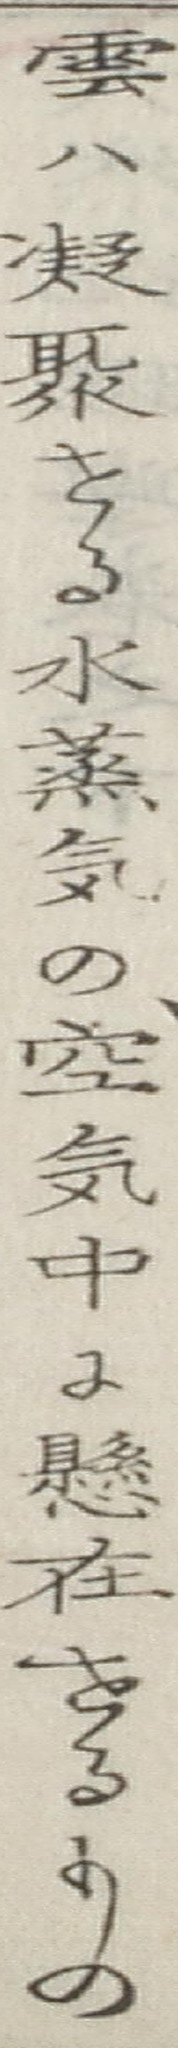雲は凝聚する水蒸気の、空気中に懸在せるもの
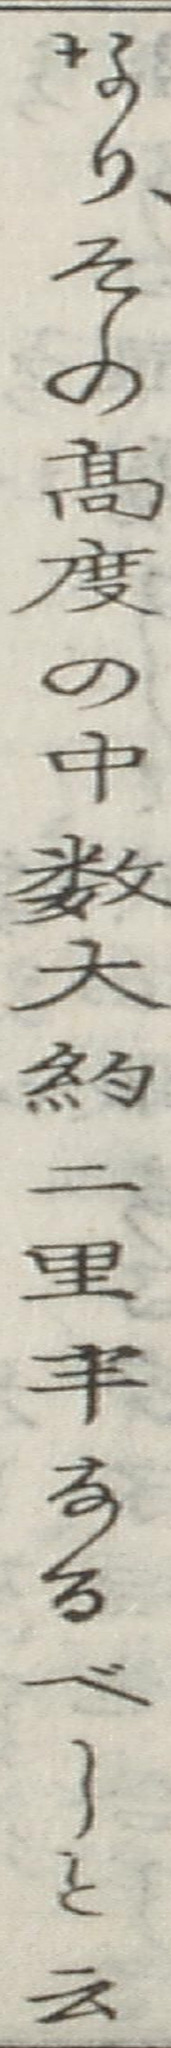なり、その高度の中数大約二里半なるべしと云
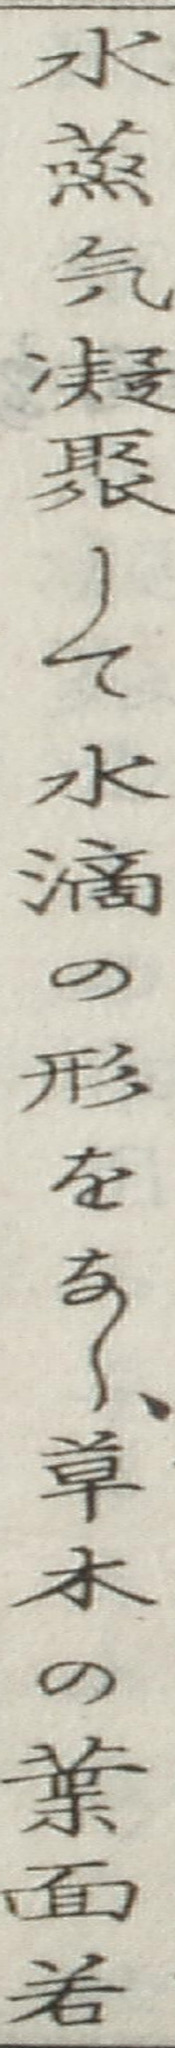水蒸気凝聚して水滴の形をなし、草木の葉面若
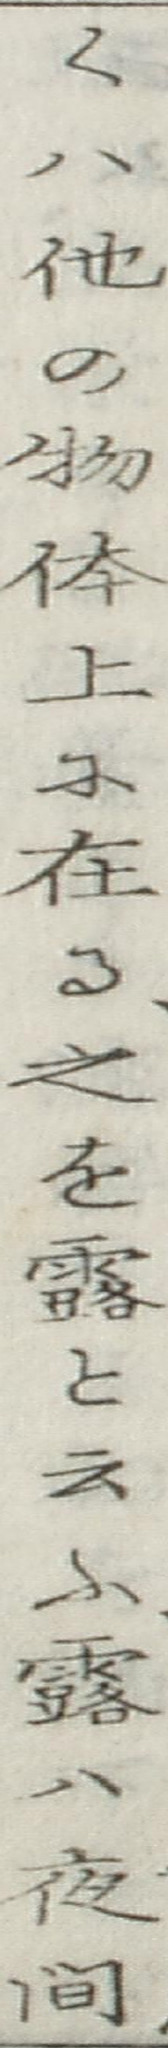くは他の物体上に在る、之を露と云ふ、露は夜間
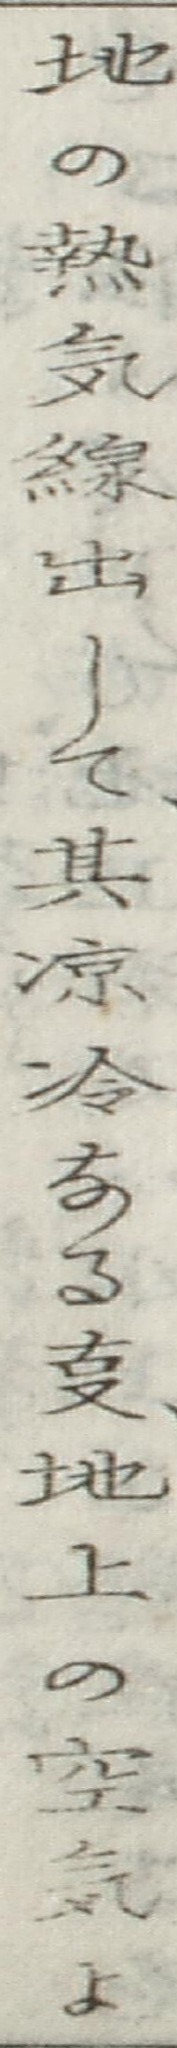地の熱気線出して、其涼冷なる事、地上の空気よ
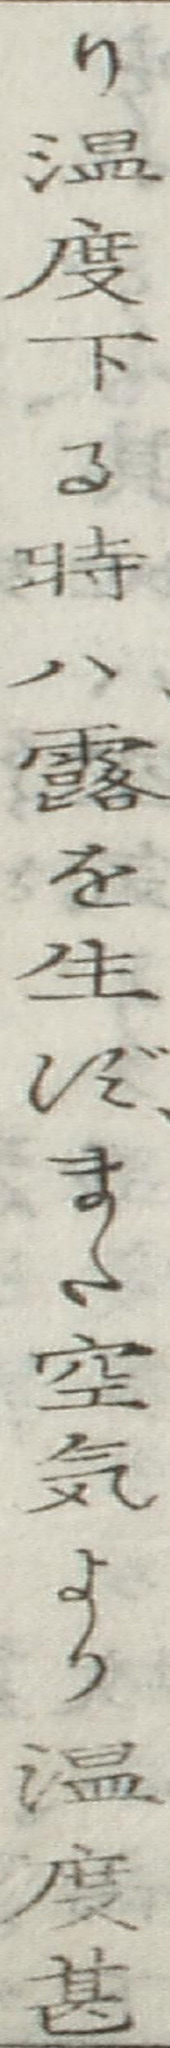り温度下る時は、露を生ず、また空気より温度甚
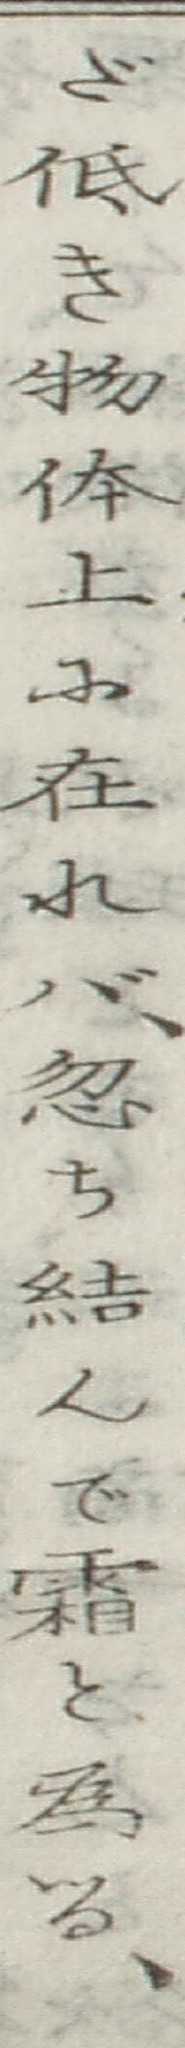だ低き物体上に在れば、忽ち結んで霜と為る、
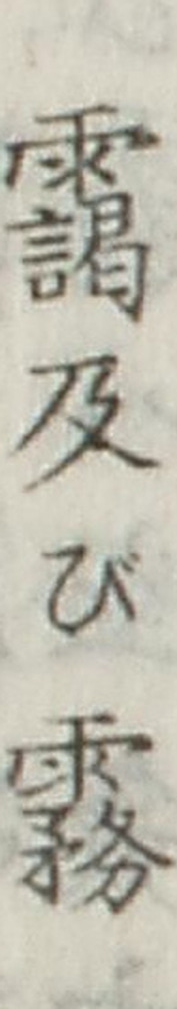靄及び霧

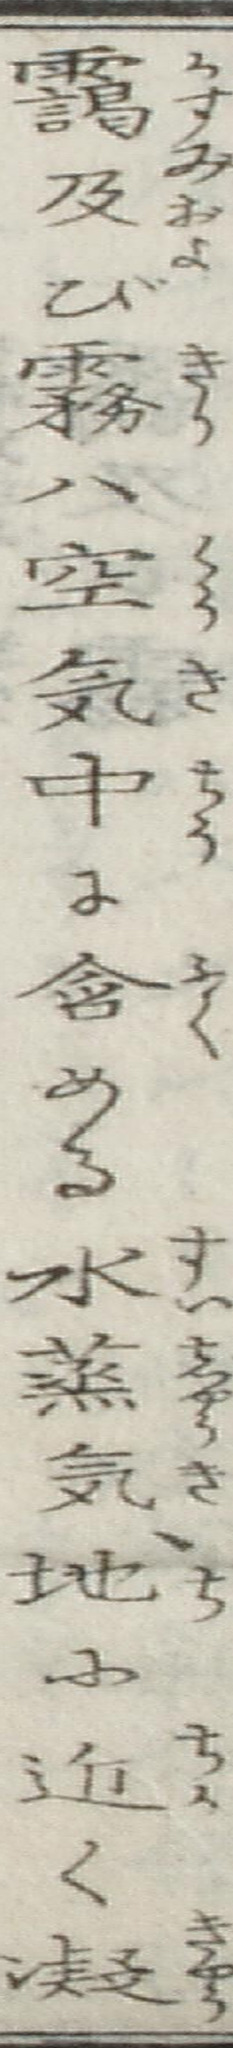靄及び霧は空気中に含める水蒸気、地に近く凝
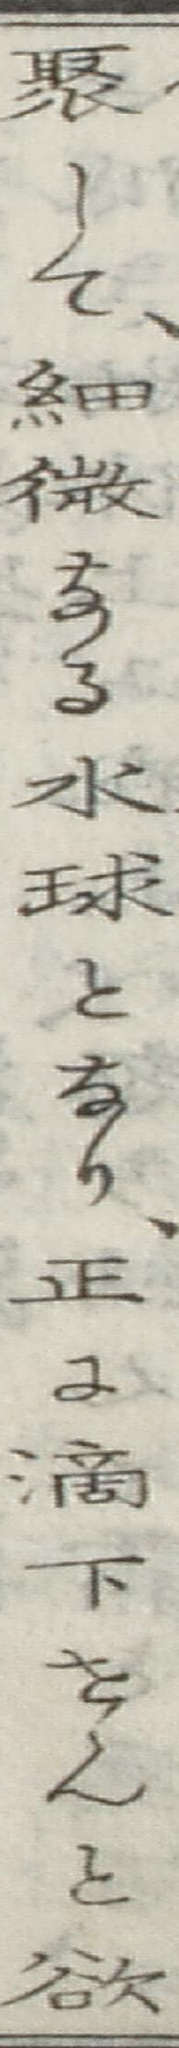聚して、細微なる水球となり、正に滴下せんと欲
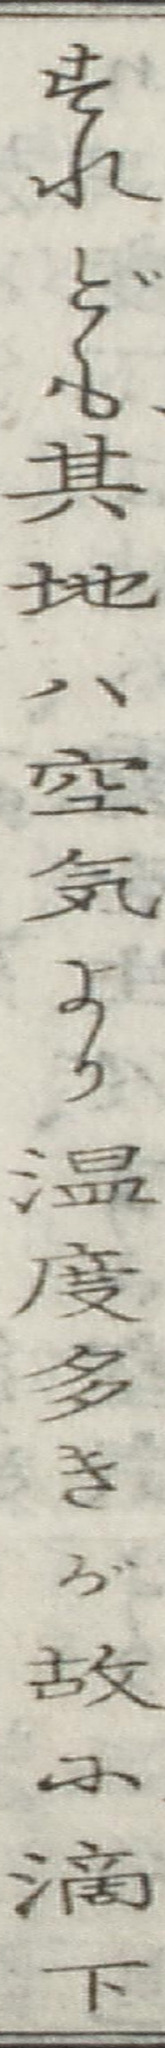すれども、其地は空気より温度多きが故に、滴下
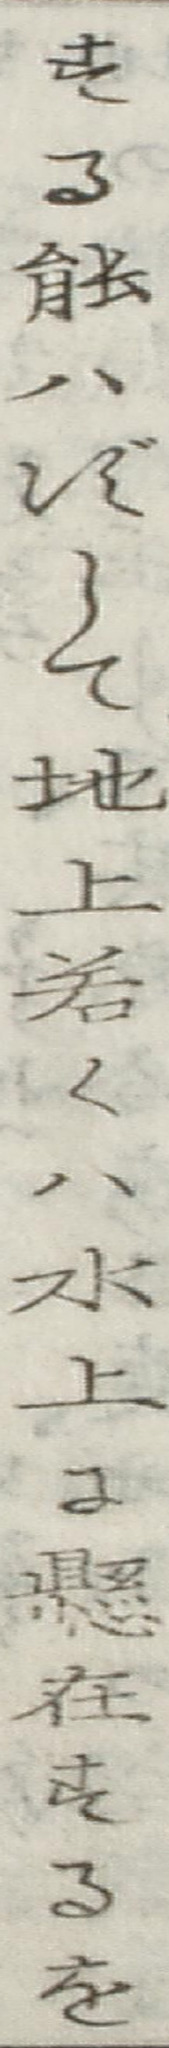する能はずして、地上若くは水上に懸在するを
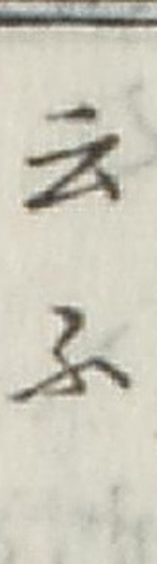云ふ、
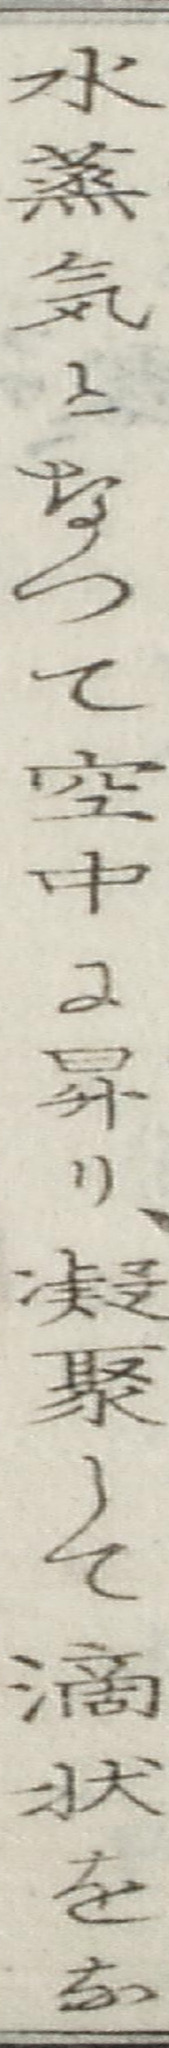水蒸気となつて空中に昇り、凝聚して滴状をな
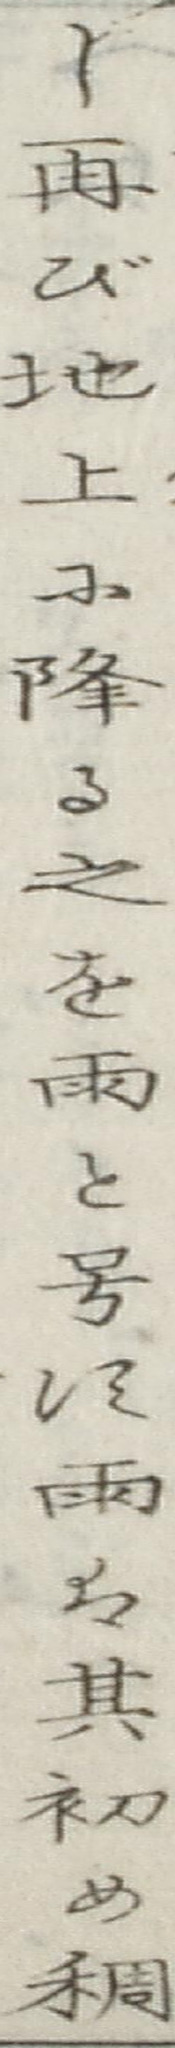し再び地上に降る之を雨と号す、雨は其初め稠
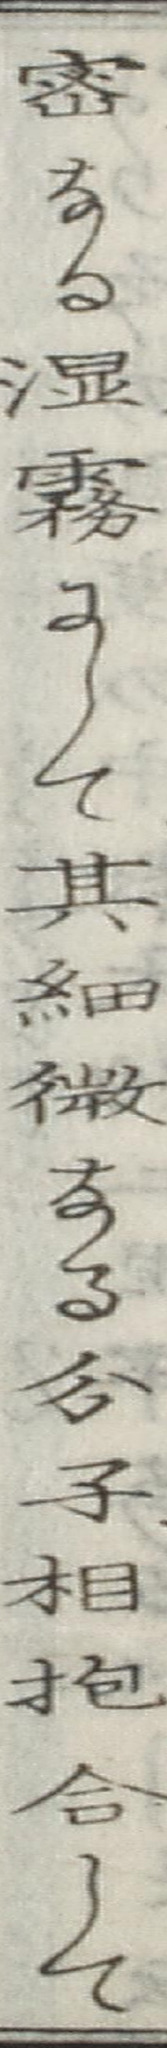密なる湿霧にして、其細微なる分子、相抱合して
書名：訓蒙　天然地理學　下
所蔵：東京大学地震研究所図書室 Earthquake Research Institute Library, The University of Tokyo, JAPAN
